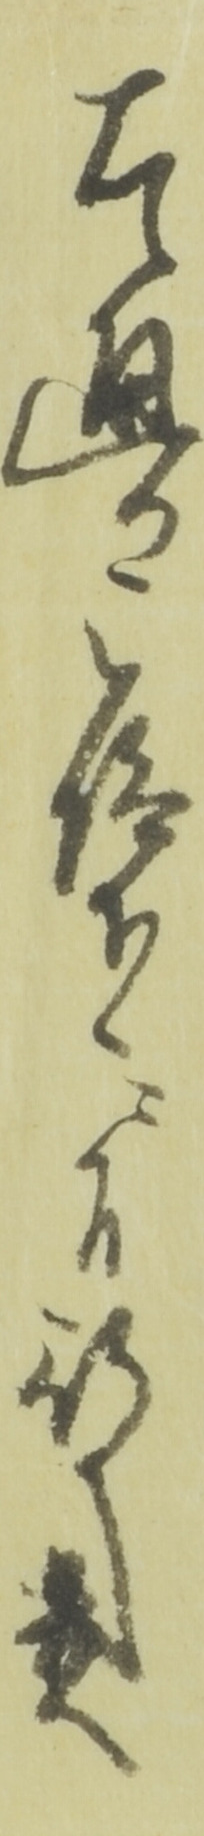右之通り被仰下候ニ付行司へ
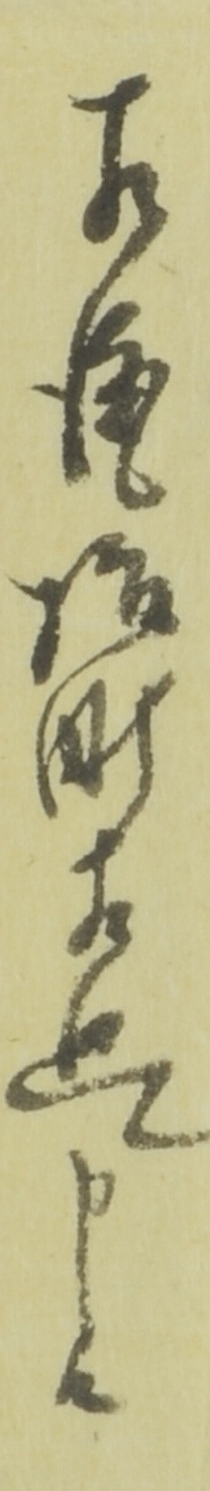相渡候拾町相廻シ申候
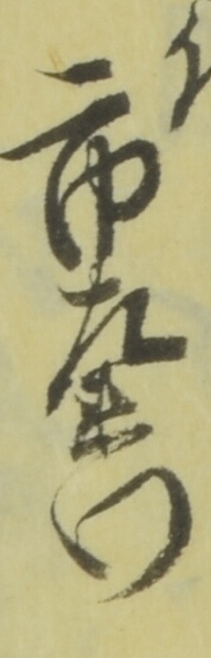市左衛門
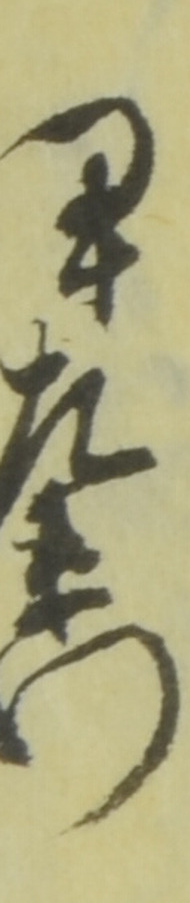市左衛門

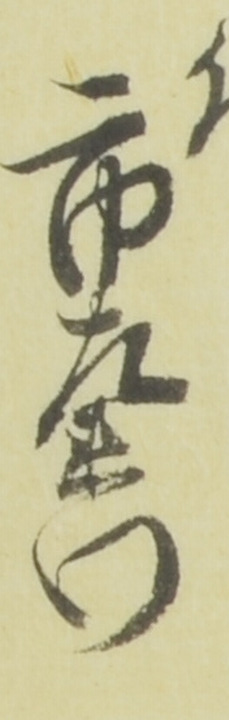市左衛門
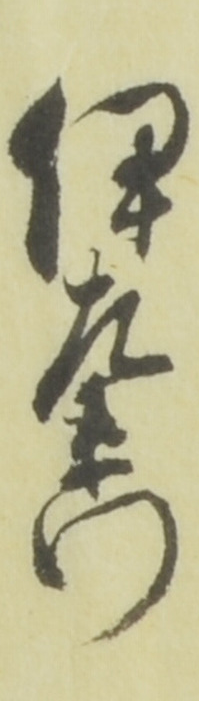市左衛門
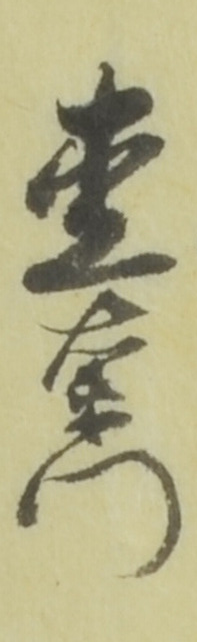治右衛門
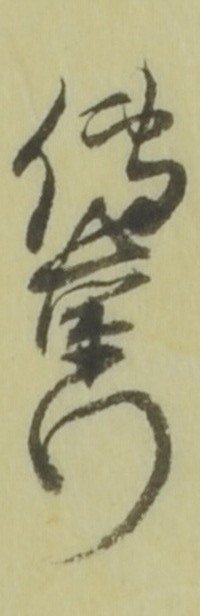伝右衛門
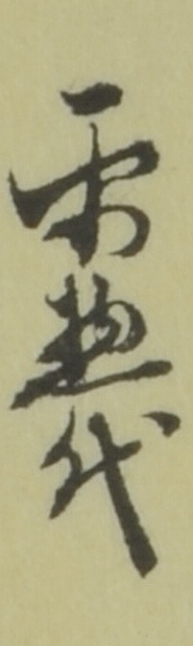東惣代
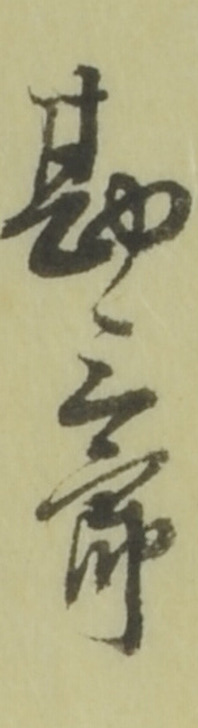勘三郎

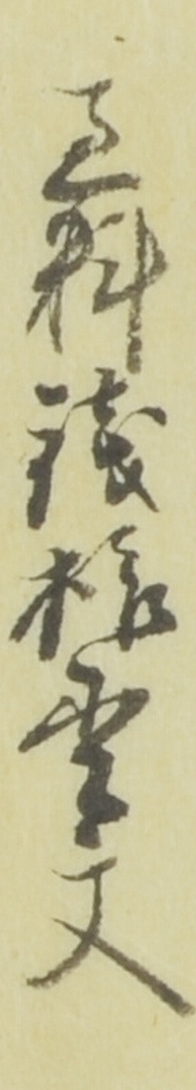過料銭様貫文
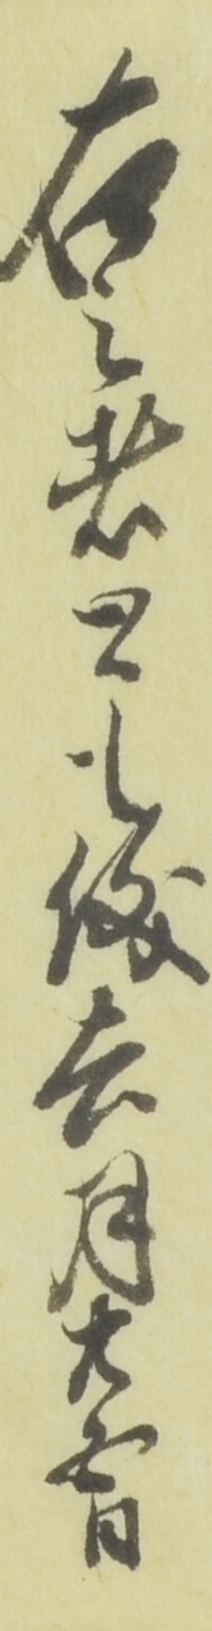右之者とも儀去月廿五日
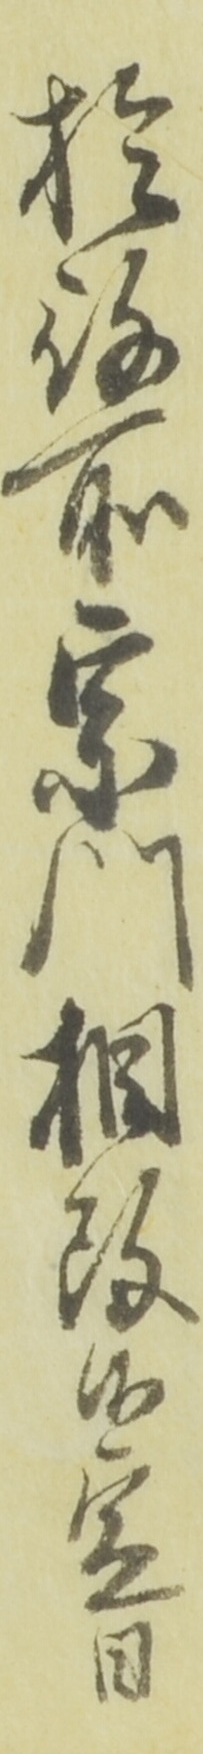於役所宗門相改候定日
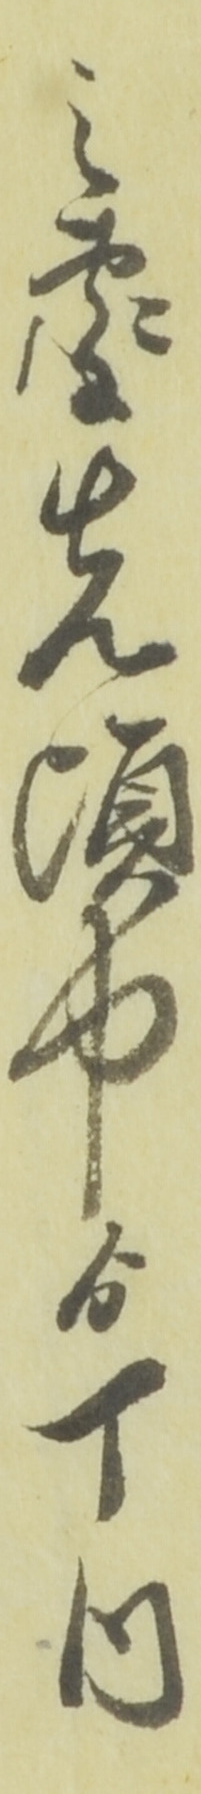之処先頃中ゟ丁内
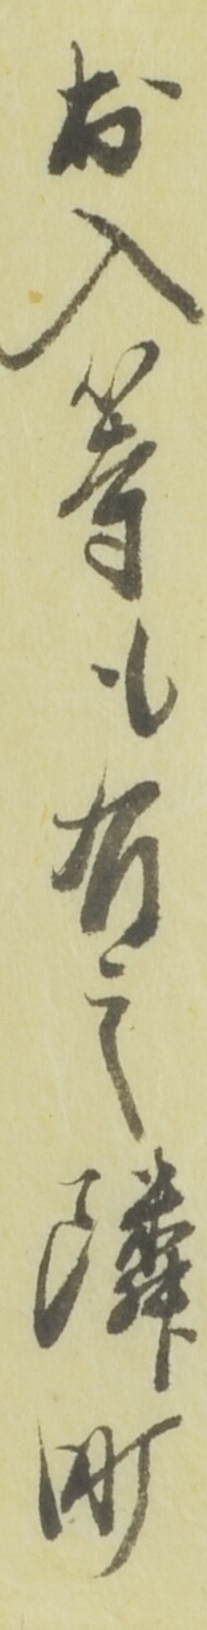出入等も有之隣町
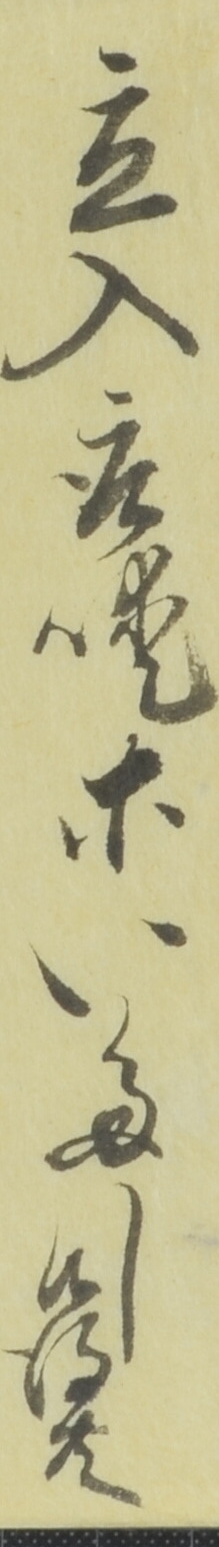立入取噯等いたし候得共
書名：御触書御書附控
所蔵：伊那市立高遠町図書館・合同会社AMANE
